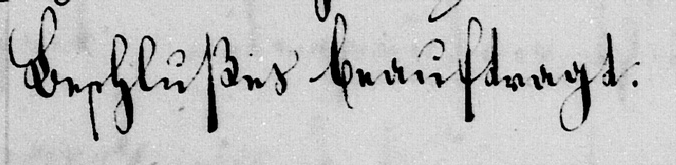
Beschlußes beauftragt.
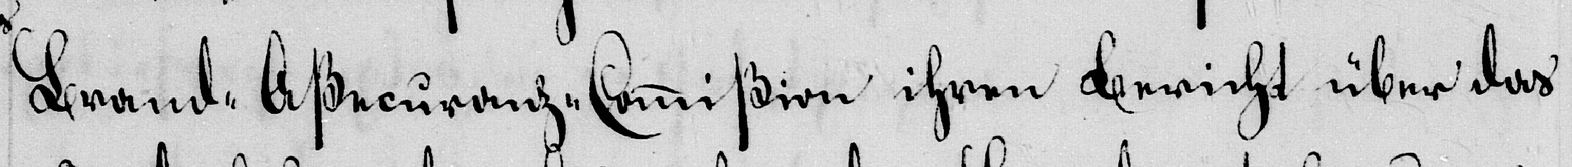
Brand-Aßecuranz-Commißion ihren Bericht über das
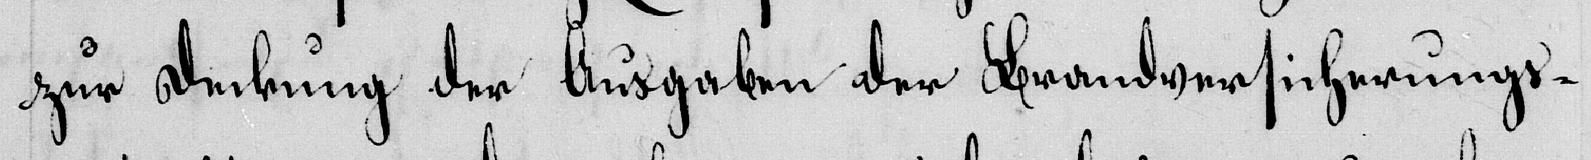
zur Deckung der Ausgaben der Brandversicherungs¬
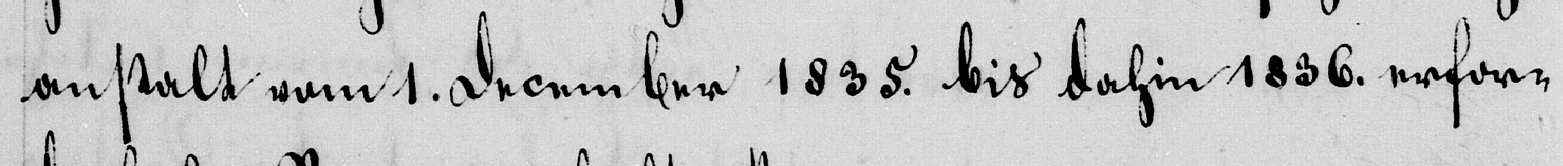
anstalt vom 1. December 1835. bis dahin 1836. erfor¬
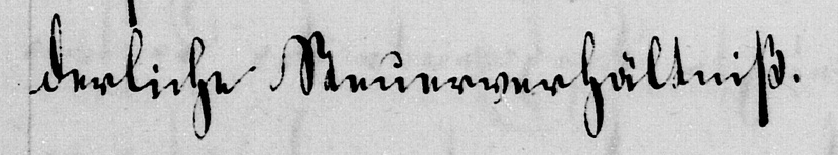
derliche Steuerverhältniß.
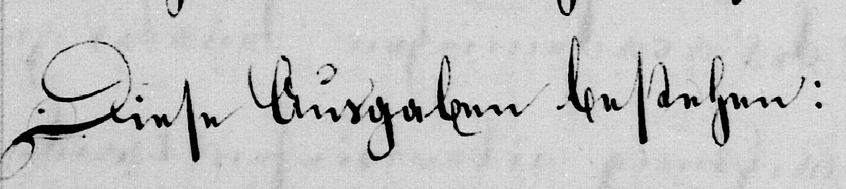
Diese Ausgaben bestehen:
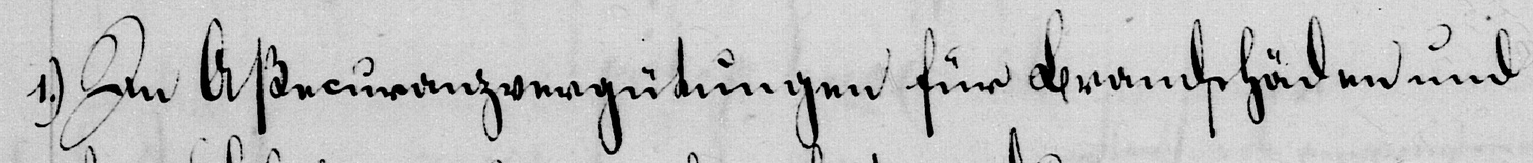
1.) In Aßecuranzvergütungen für Brandschäden und
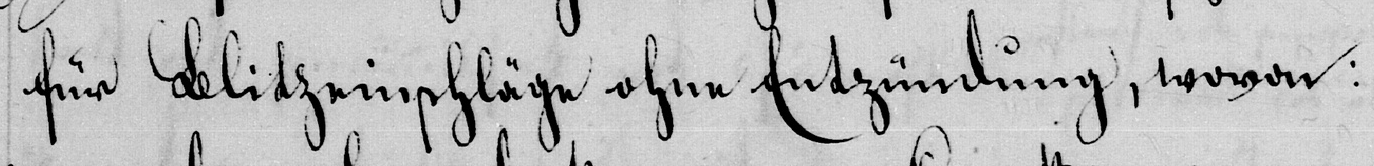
für Blitzeinschläge ohne Entzündung, wovon:
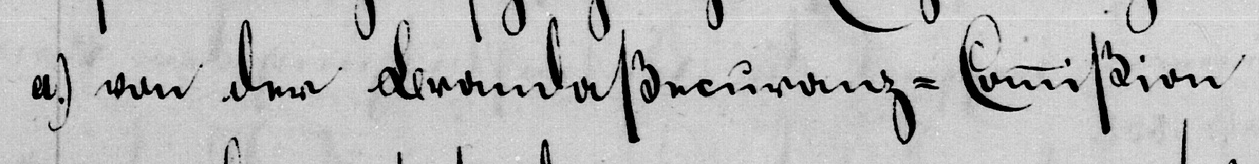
a.) von der Brandaßecuranz-Commißion
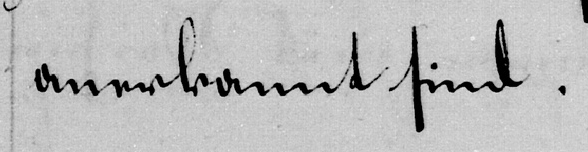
anerkannt sind
